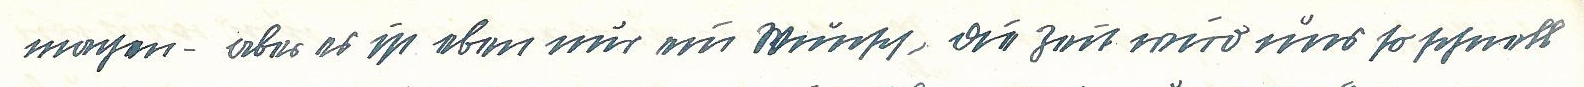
machen – aber es ist eben nur ein Wunsch, die Zeit wird uns so schnell
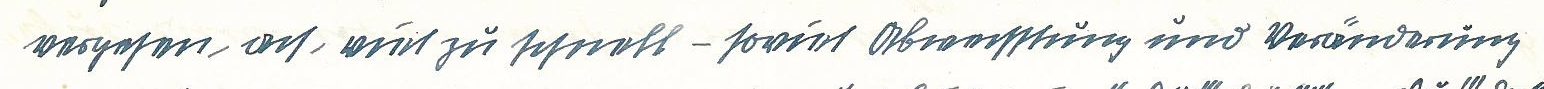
vergehen, ach, viel zu schnell – soviel Abwechslung und Veränderung
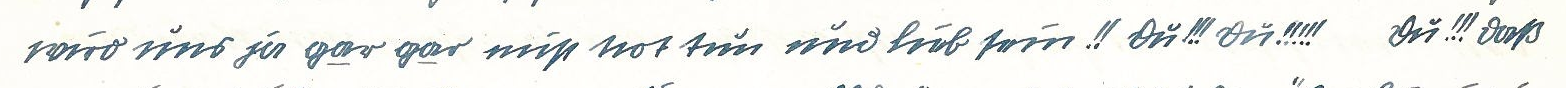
wird uns ja gar gar nicht not tun und lieb sein!! Du!!! Du!!!!! Du!!! daß
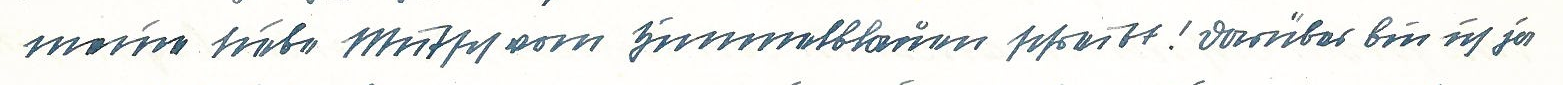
meine liebe Mutsch vom Himmelblauen schreibt! Darüber bin ich ja
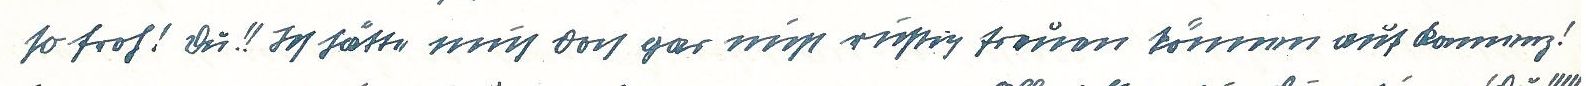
so froh! Du!! Ich hätte mich doch gar nicht richtig freuen können auf K.!
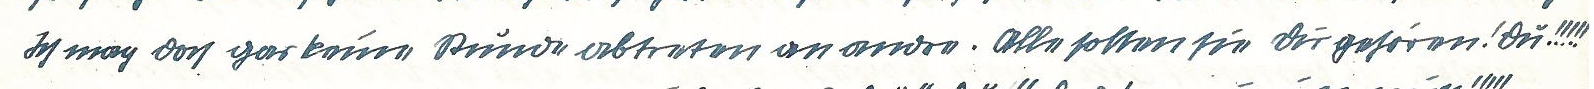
Ich mag doch gar keine Stunde abtreten an andre. Alle sollen sie Dir gehören! Du!!!!!
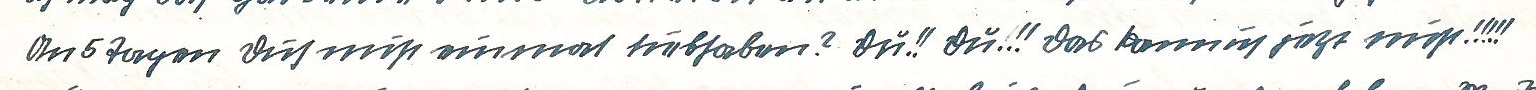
An 5 Tagen Dich nicht einmal liebhaben? Du!! Du!!! Das kann ich jetzt nicht!!!!!
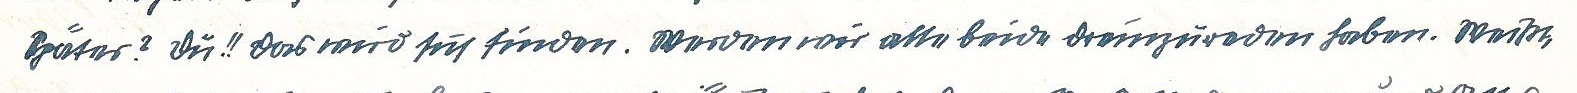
Später? Du!! Das wird sich finden. Werden wir alle beide dreinzureden haben. Weißt,
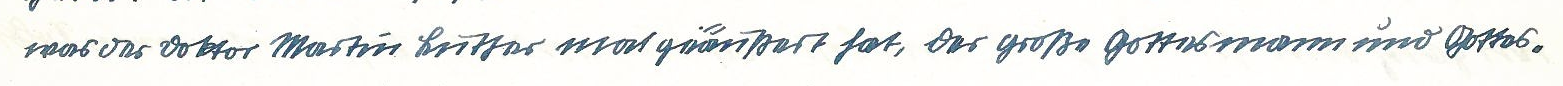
was der Dr. Martin Luther mal geäußert hat, der große Gottesmann und Gottes¬
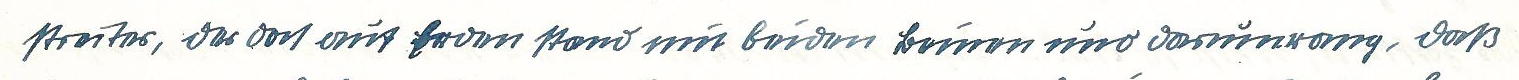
streiter, der doch auf Erden stand mit beiden Beinen und darum rang, daß
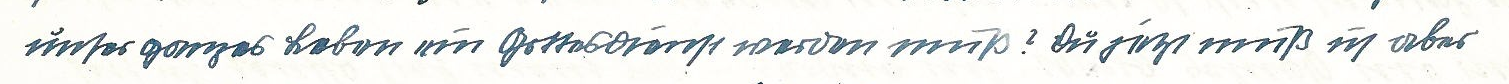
unser ganzes Leben ein Gottesdienst werden muß? Du jetzt muss ich aber
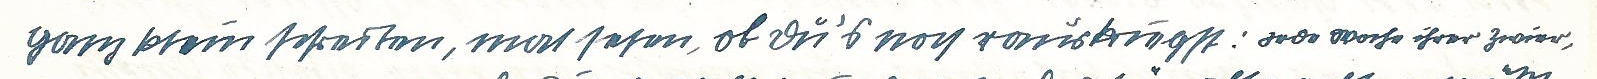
ganz klein schreiben, mal sehen, ob Du’s noch rauskriegst: jede Woche ihrer zweier,
